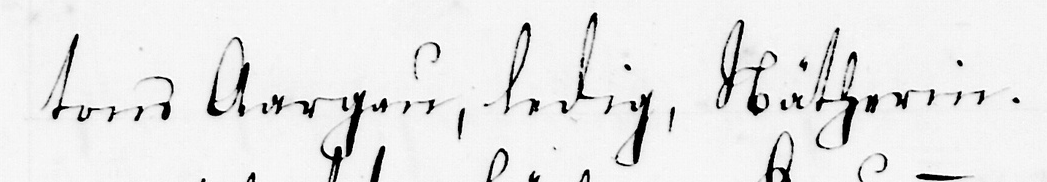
tons Aargau, ledig, Nätherin.
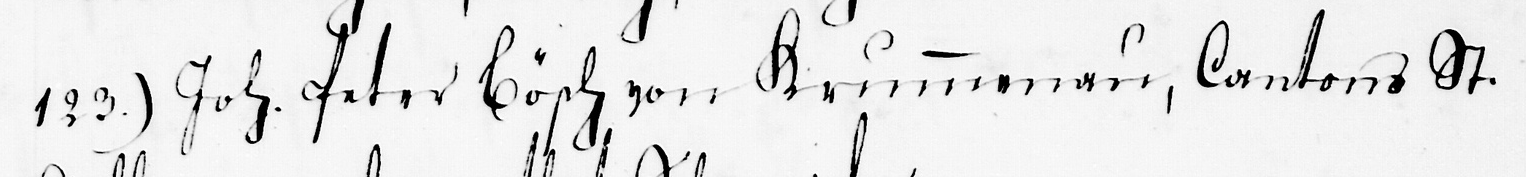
123.) Joh. Peter Bösch von Krummenau, Cantons St.
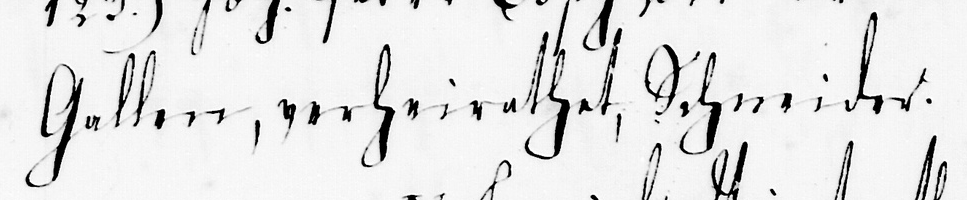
Gallen, verheirathet, Schneider.
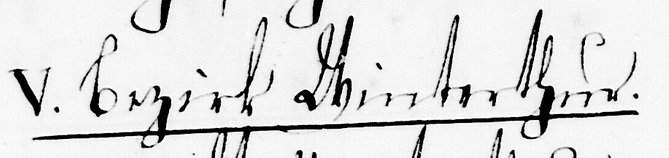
V. Bezirk Winterthur.
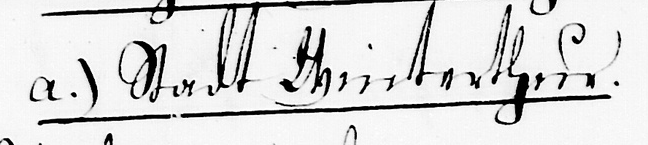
a.) Stadt Winterthur.
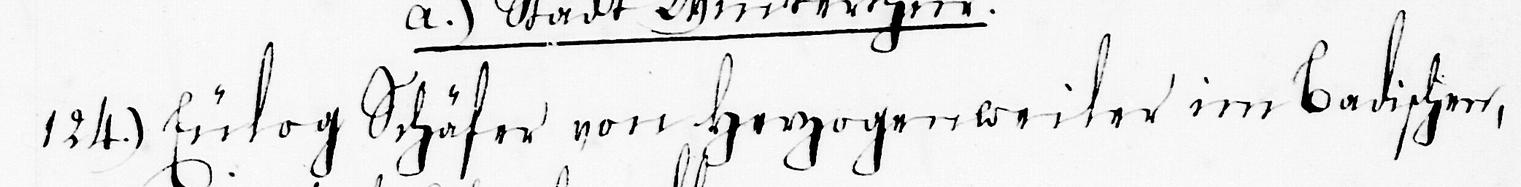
124.) Eulog Schäfer von Herzogenweiler im Badischen,
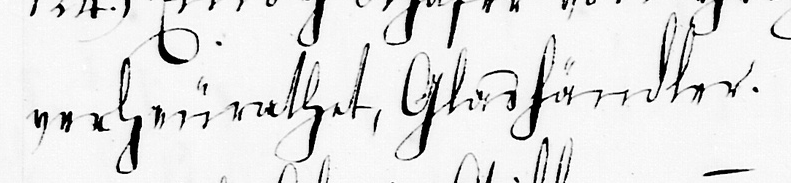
verheurathet, Glashändler.
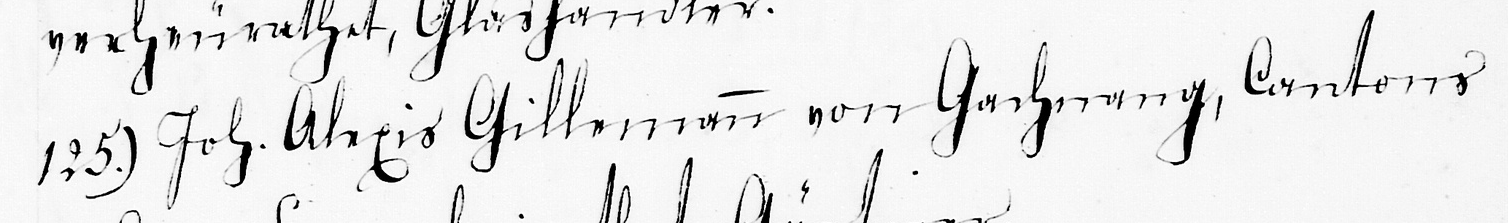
125.) Joh. Alexis Gillemann von Gachnang, Cantons
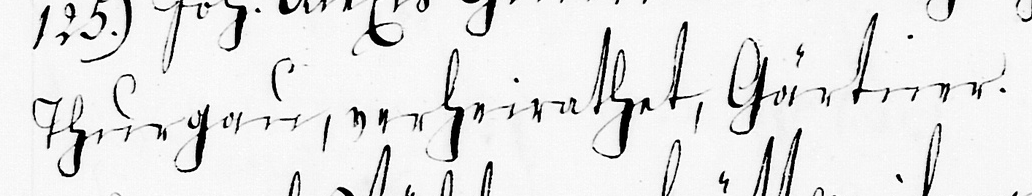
Thurgau, verheirathet, Gärtner.
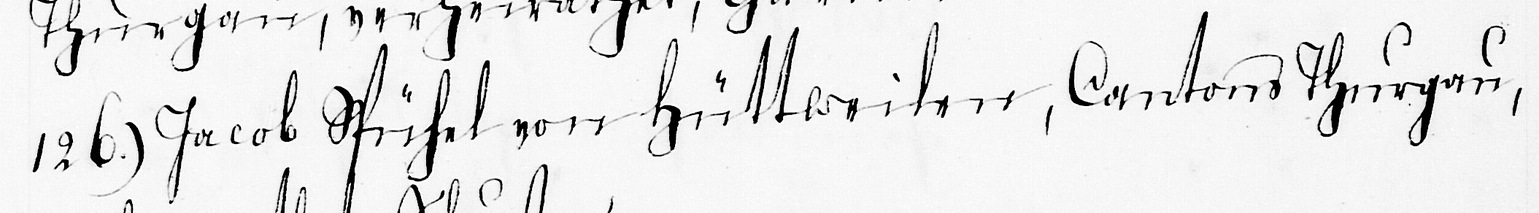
126. Jacob Spühel von Hüttweilen, Cantons Thurgau,
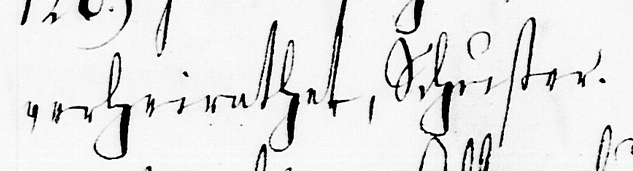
verheirathet, Schuster.
